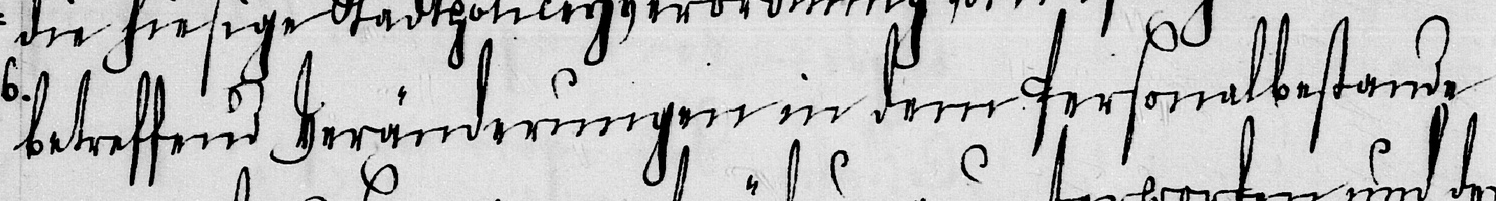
betreffend Veränderungen in dem Personalbestande
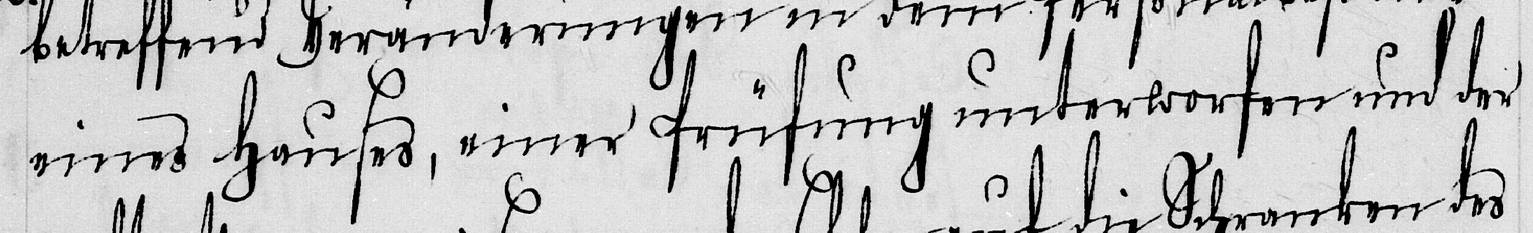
eines Hauses, einer Prüfung unterworfen und der
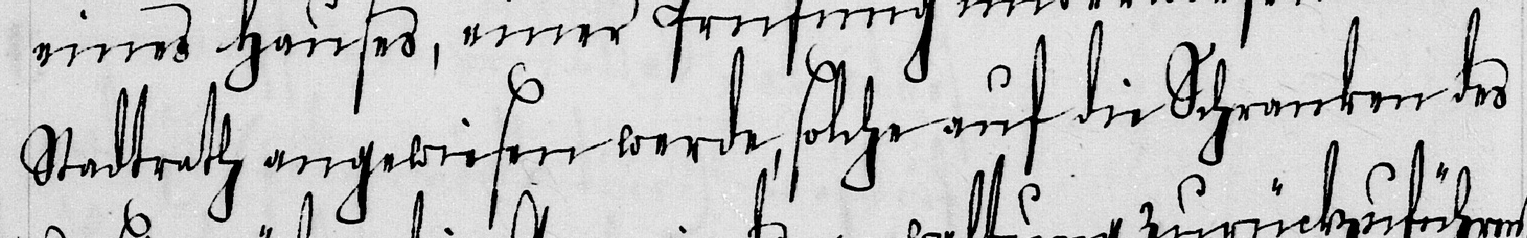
Stadtrath angewiesen werde, solche auf die Schranken des
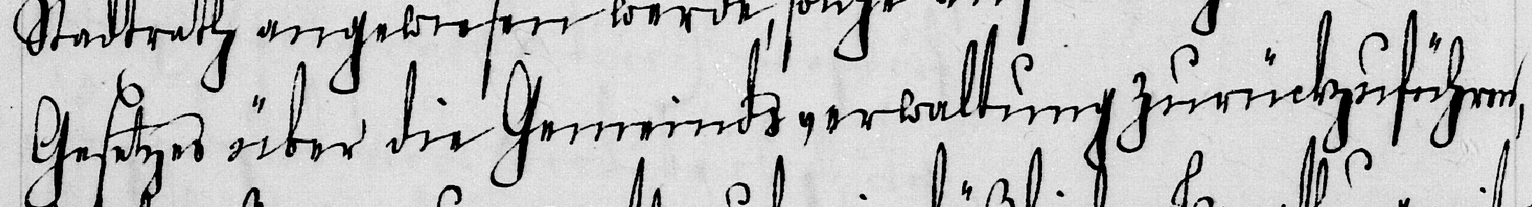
Gesetzes über die Gemeindsverwaltung zurückzuführen,
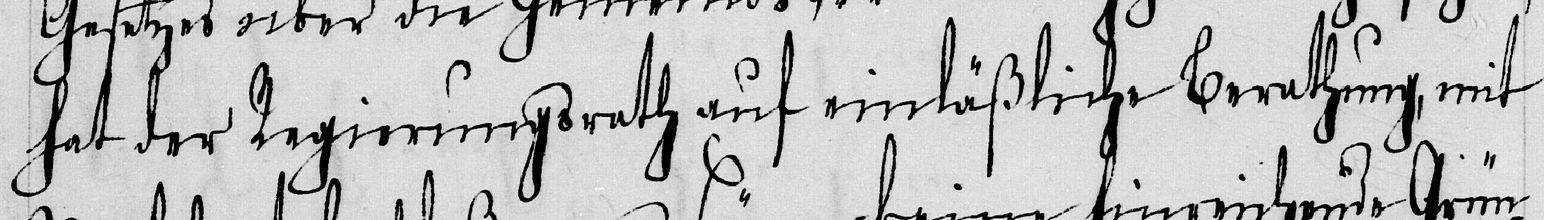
hat der Regierungsrath auf einläßliche Berathung, mit
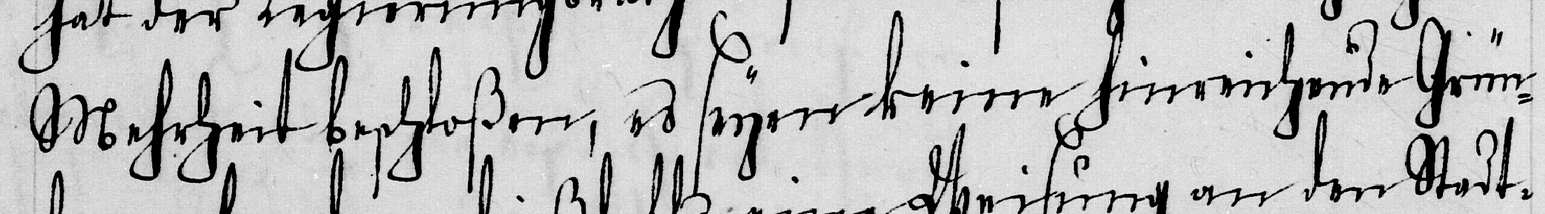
Mehrheit beschloßen, es seyen keine hinreichende Grün¬
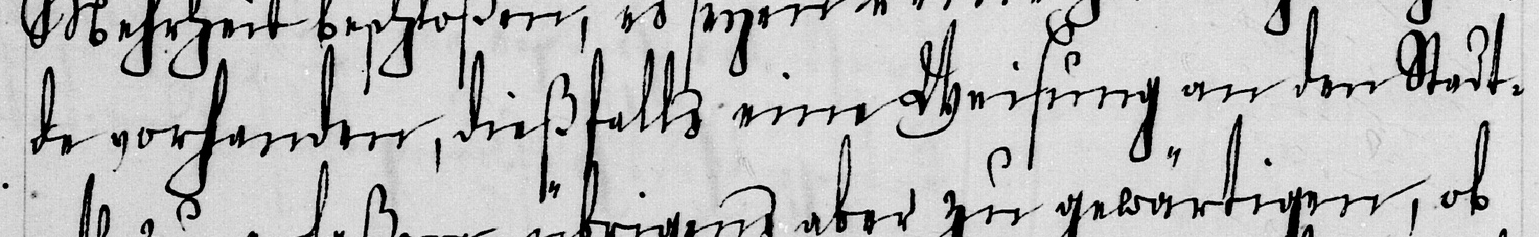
de vorhanden, dießfalls eine Weisung an den Stadt¬
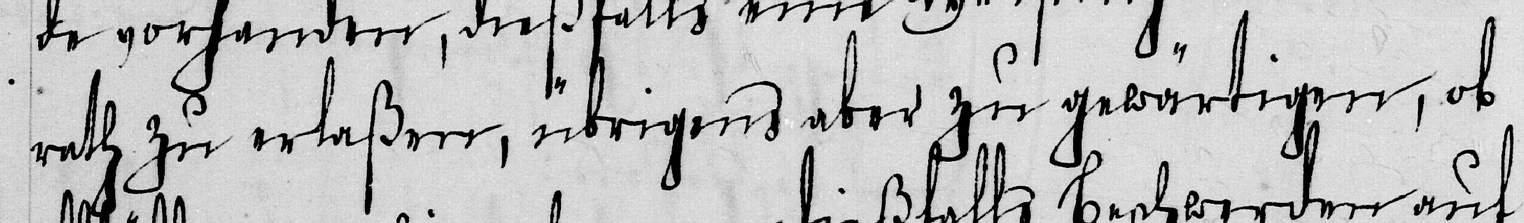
rath zu erlaßen, übrigens aber zu gewärtigen, ob
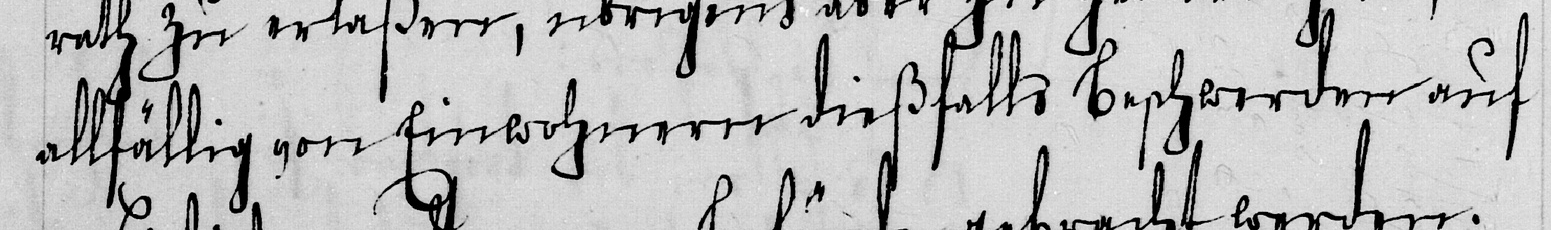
allfällig von Einwohnern dießfalls Beschwerden auf
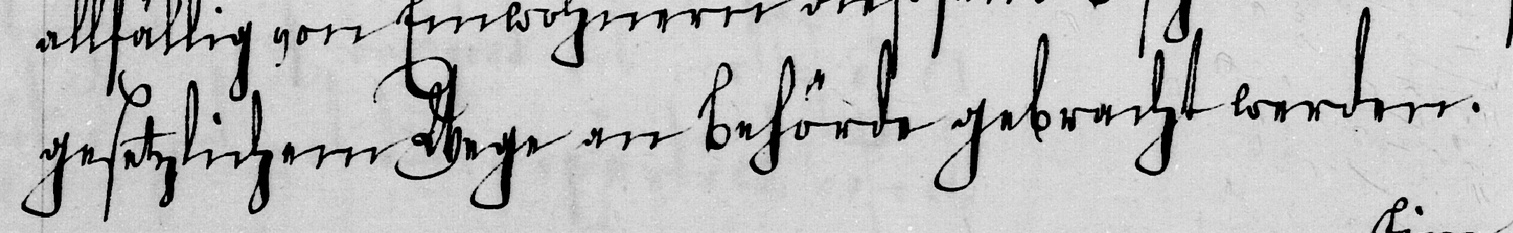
gesetzlichem Wege an Behörde gebracht werden.
